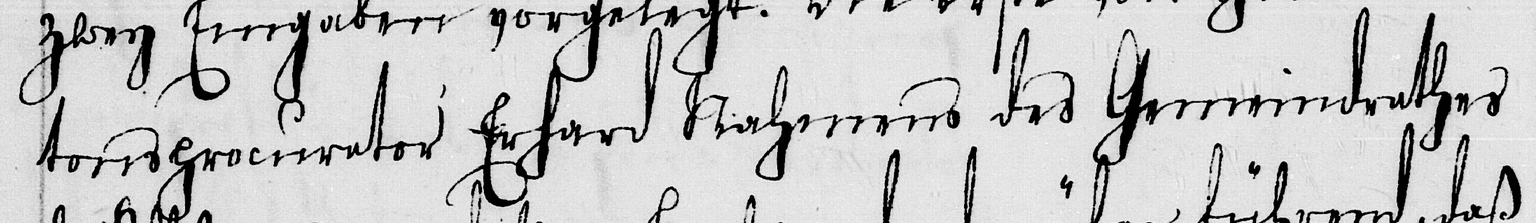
tonsprocurator Erhard Nahmens des Gemeindrathes
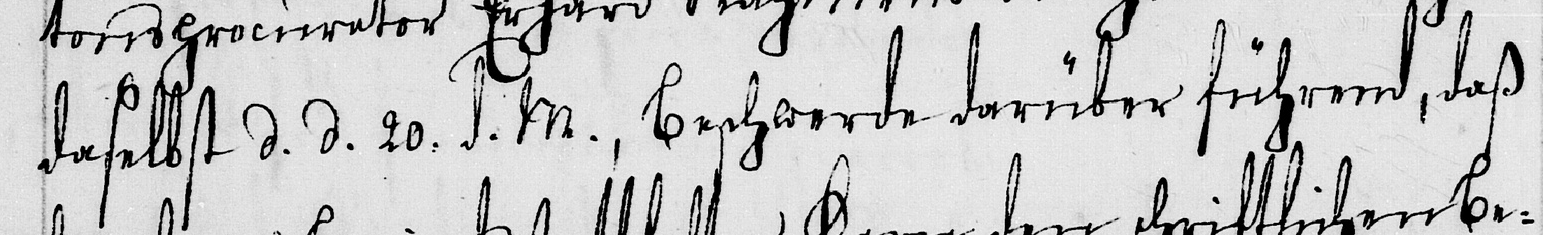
daselbst d. d. 20. d. M., Beschwerde darüber führend, daß
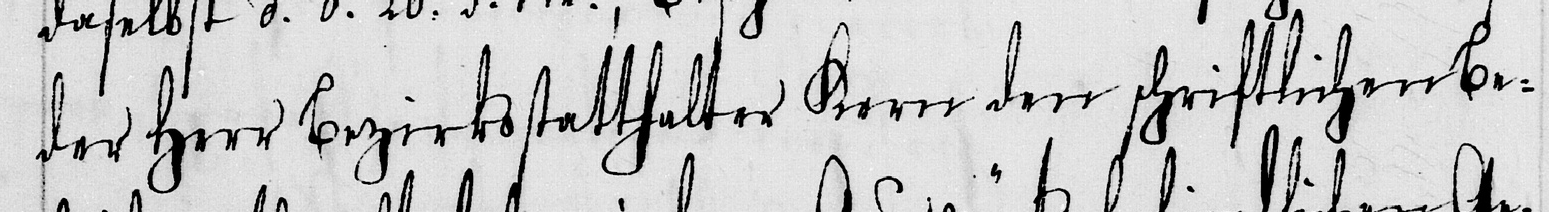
der Herr Bezirksstatthalter Kern den schriftlichen Be¬
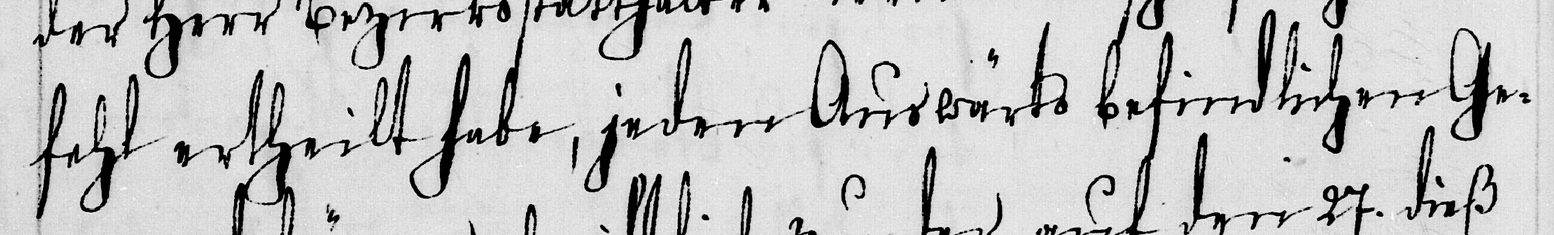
fehl ertheilt habe, jeden Auswärts befindlichen Ge¬
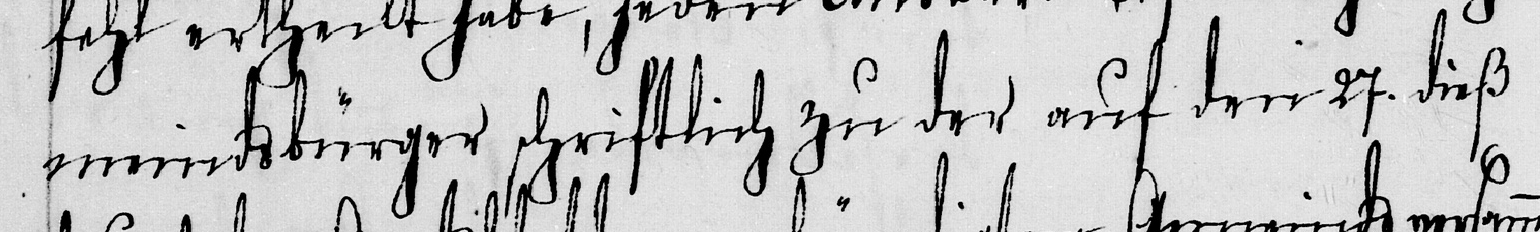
meindsbürger schriftlich zu der auf den 27. dieß
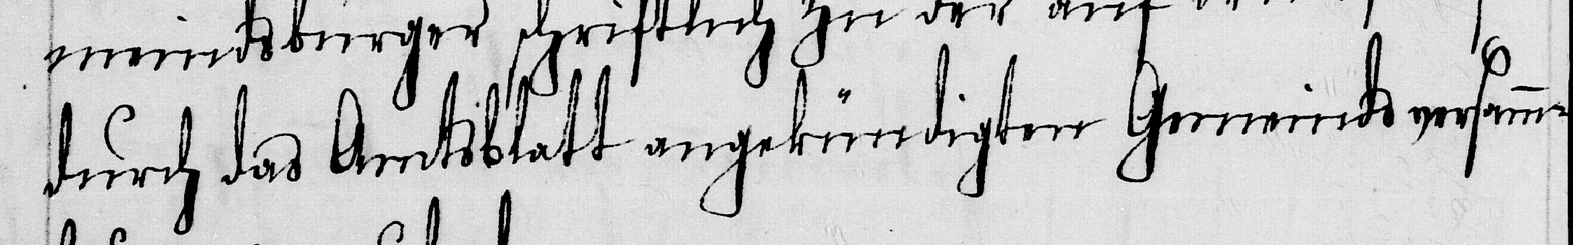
durch das Amtsblatt angekündigten Gemeindsversam¬
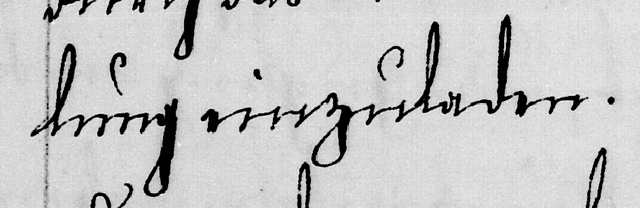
mlung einzuladen.
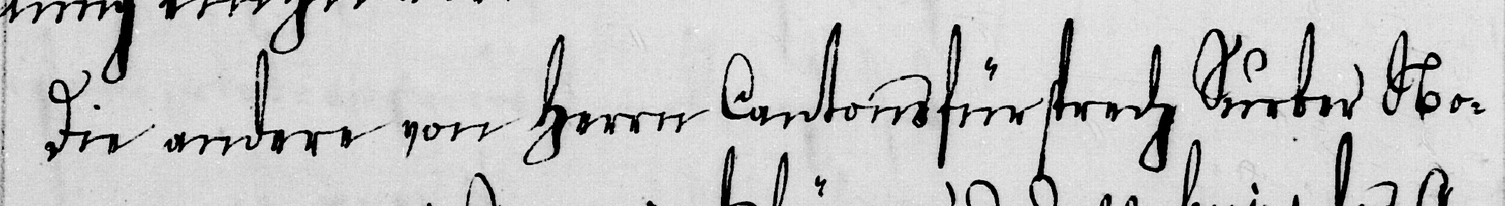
Die andere von Herrn Cantonsfürsprech Surber No¬
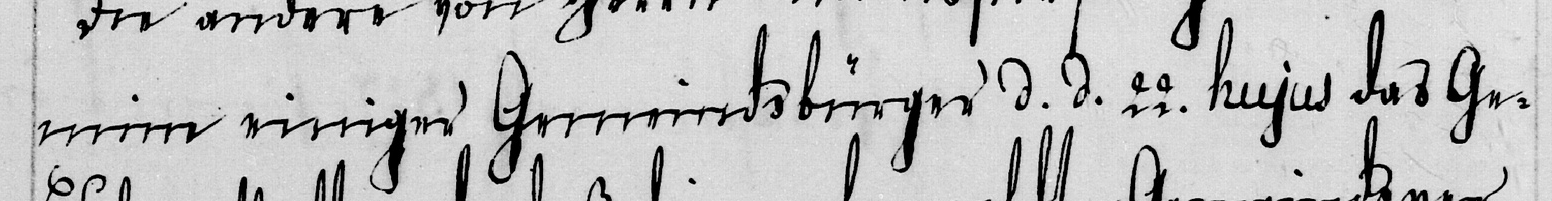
mine einiger Gemeindsbürger d. d. 22. hujus das Ge¬
